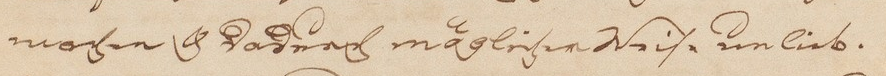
machen & dadurch möglicher Weise unlieb-
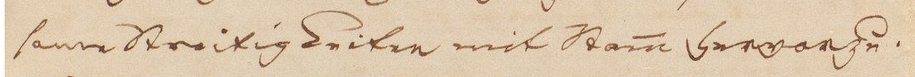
same Streitigkeiten mit Stamm hervorzu-
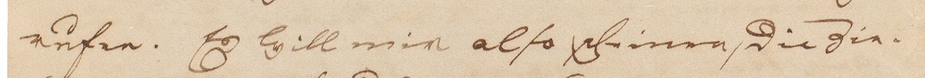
rufen. Es will mir also scheinen, die Zie-
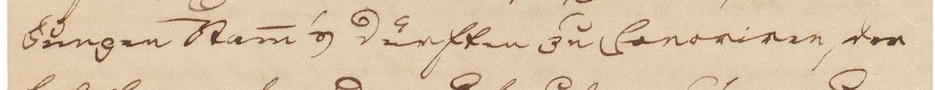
hungen Stamm's dürften zu honoriren, der
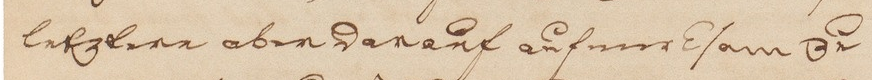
letztere aber darauf aufmerksam zu
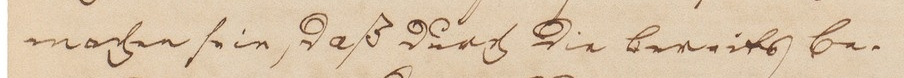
machen sein, daß durch die bereits be-
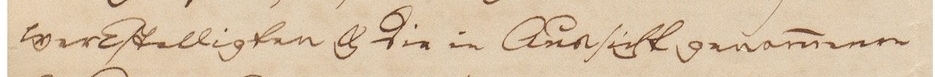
werkstelligten & die in Aussicht genommenen
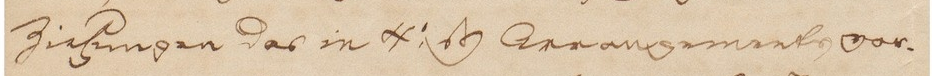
Ziehungen das in 4o des Arrangements vor-
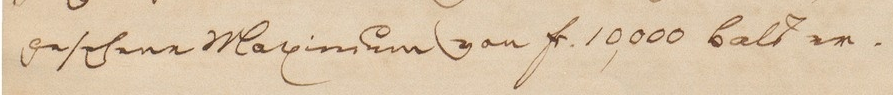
gesehene Maximum von fr. 10,000 bald er-
